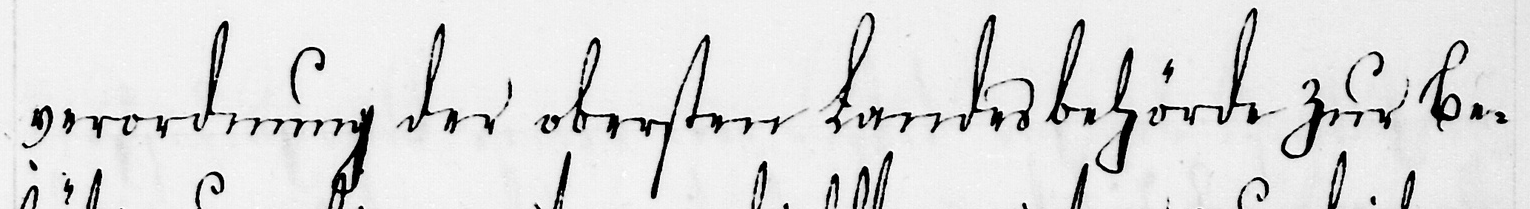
verordnung der obersten Landesbehörde zur Be¬
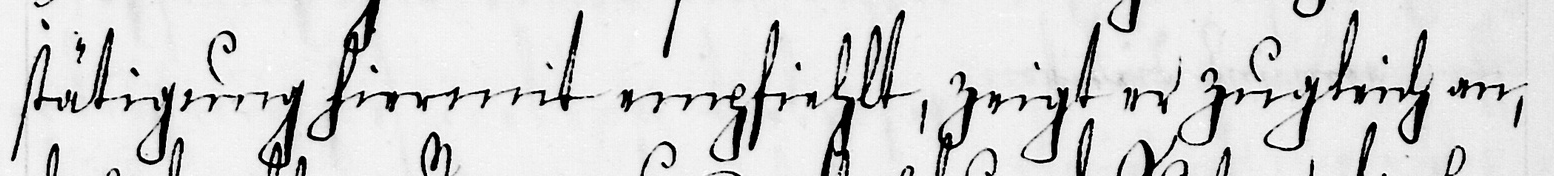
stätigung hiermit empfiehlt, zeigt er zugleich an,
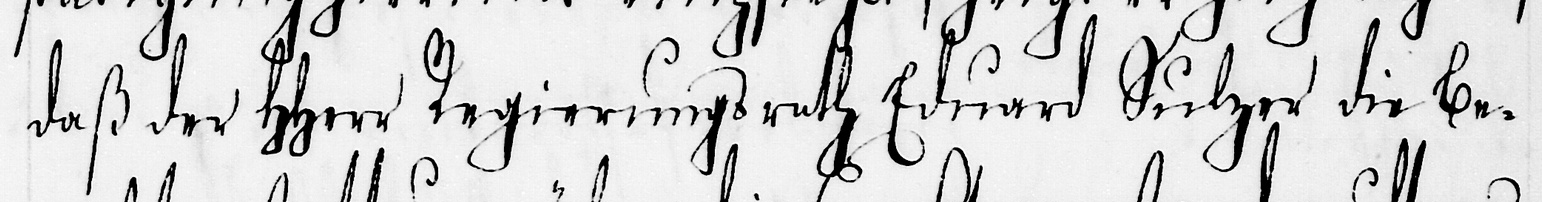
daß der HHerr Regierungsrath Eduard Sulzer die Be¬
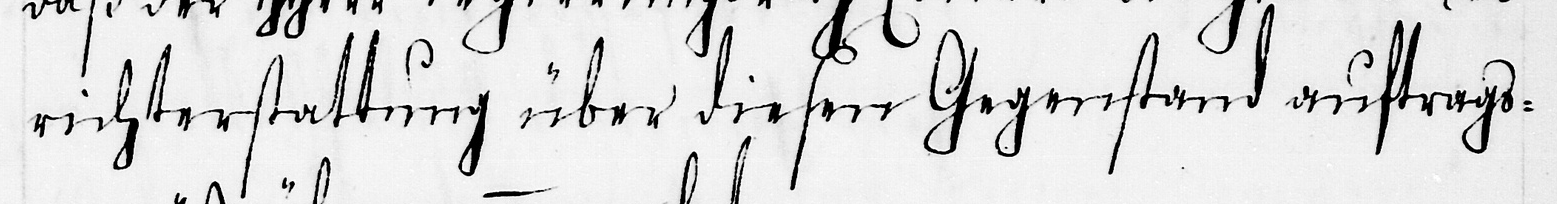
richterstattung über diesen Gegenstand auftrags¬
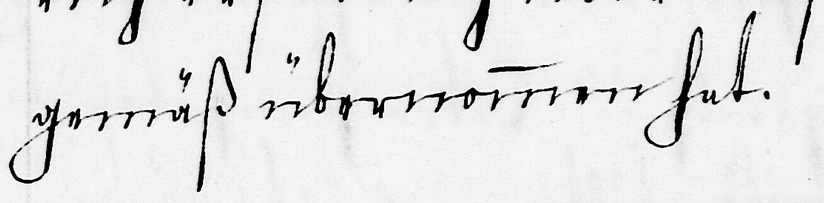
gemäß übernommen hat.
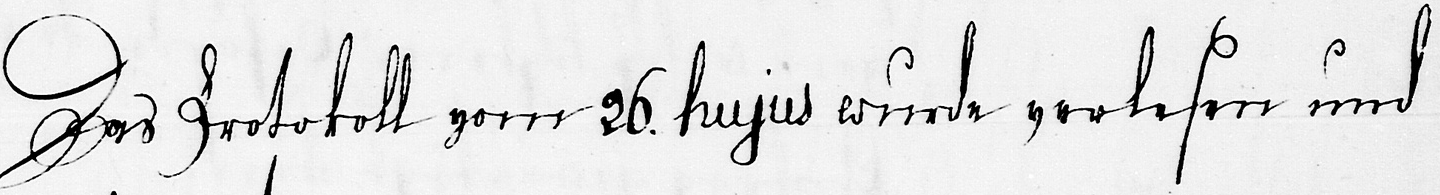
Das Protokoll vom 26. hujus wurde verlesen und
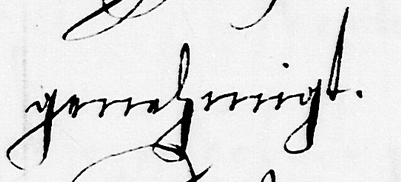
genehmigt.
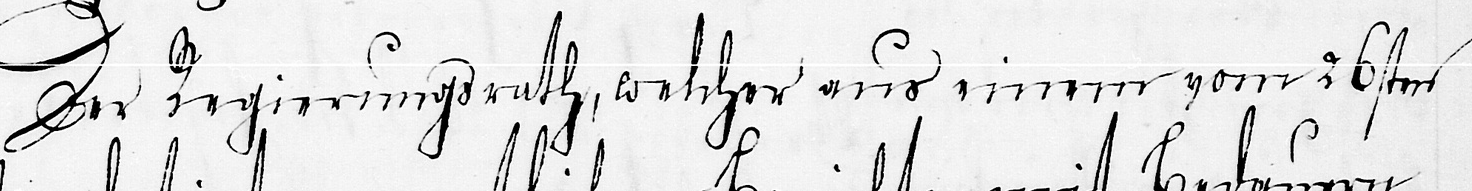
Der Regierungsrath, welcher aus einem vom 26sten
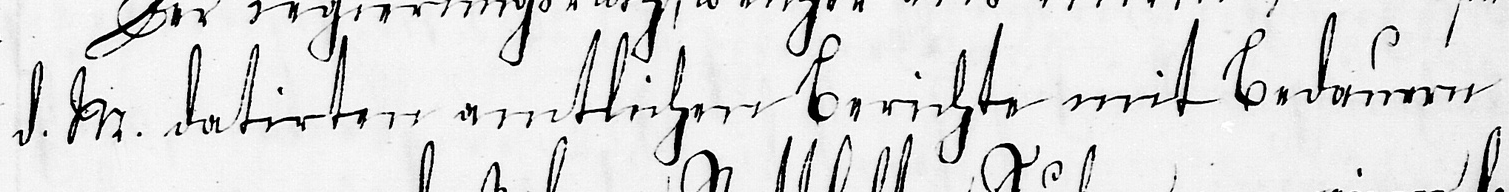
d. M. datirten amtlichen Berichte mit Bedauern
